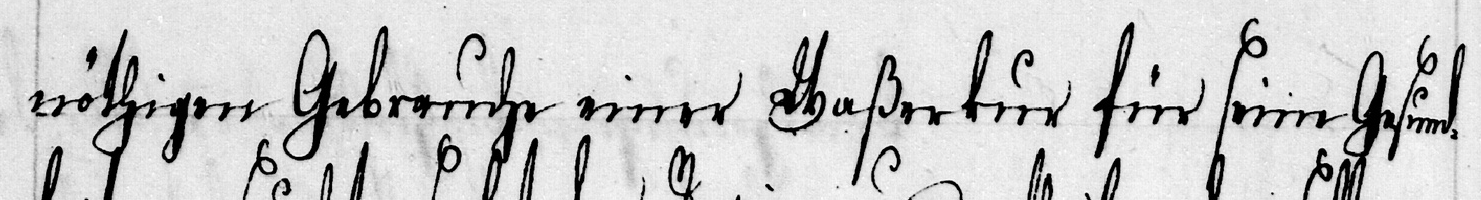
nöthigen Gebrauche einer Waßerkur für seine Gesu¬
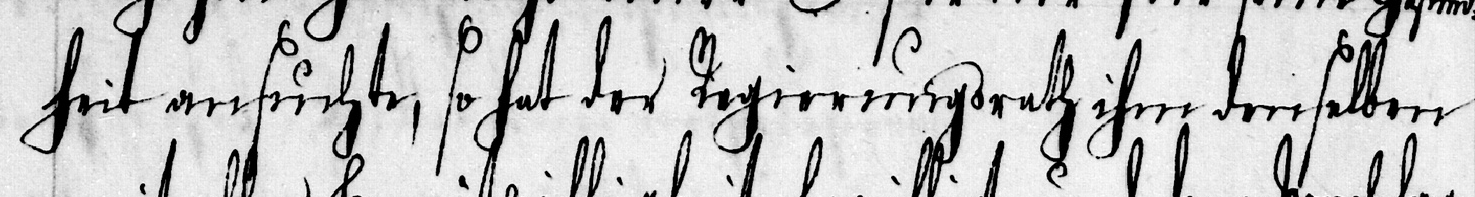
heit ansuchte, so hat der Regierungsrath ihm denselben
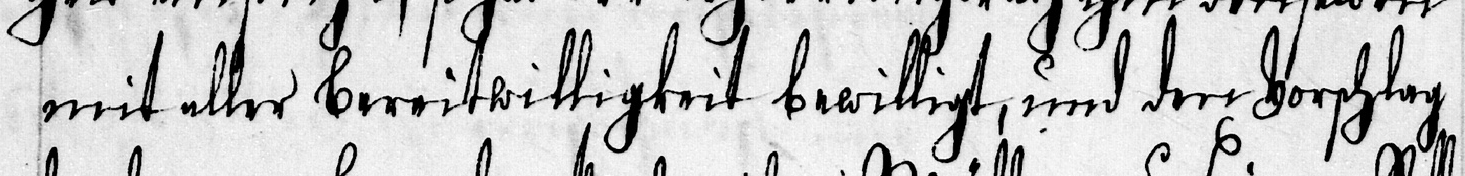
mit aller Bereitwilligkeit bewilligt, und den Vorschlag
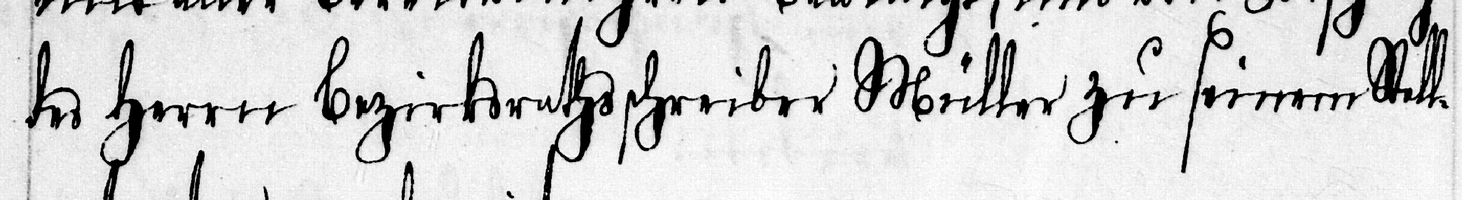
des Herrn Bezirksrathsschreiber Müller zu seinem Stel¬
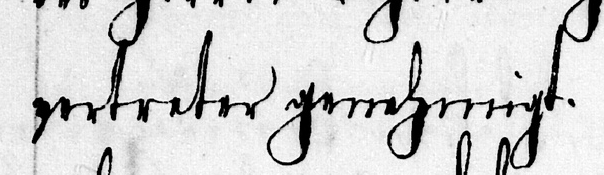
lvertreter genehmigt.
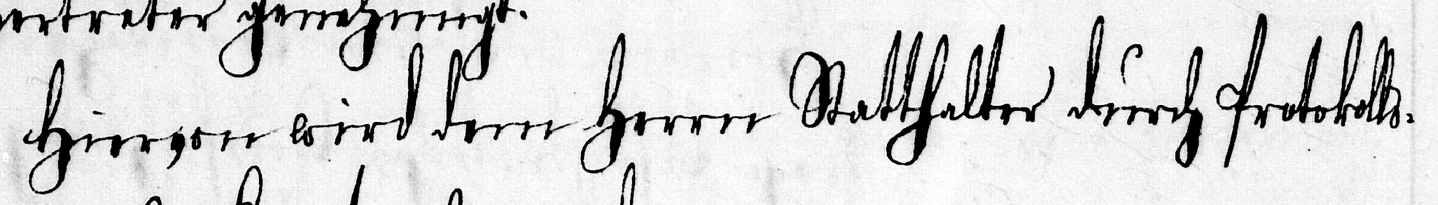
Hiervon wird dem Statthalter durch Protoko¬
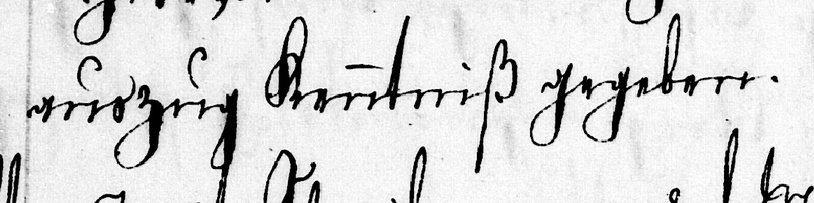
sauszug Kenntniß gegeben.
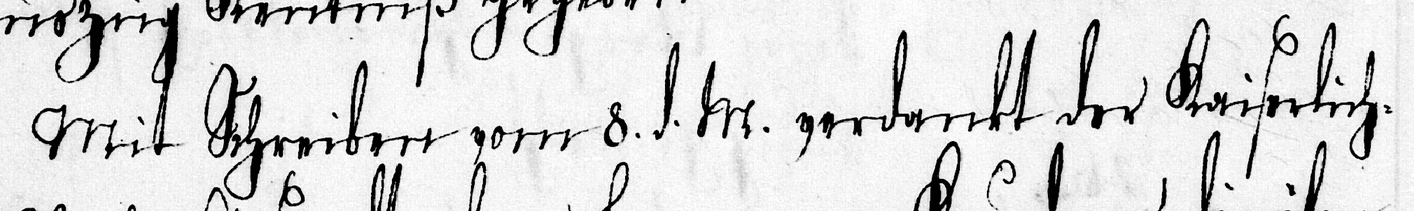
Mit Schreiben vom 8. d. M. verdankt der Kaiserlic¬
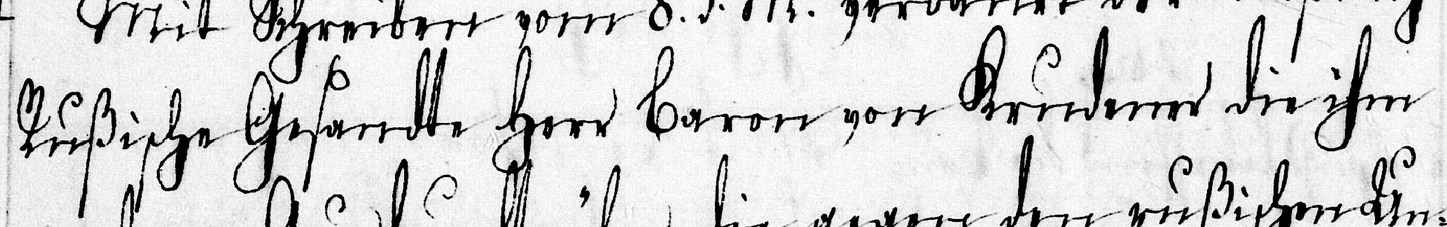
ußische Gesandte Herr Baron von Krudener die ihm
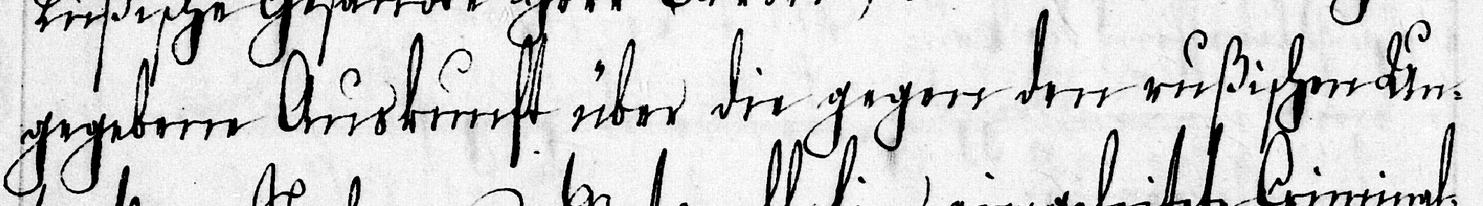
gegebene Auskunft über die gegen den rußischen Un¬
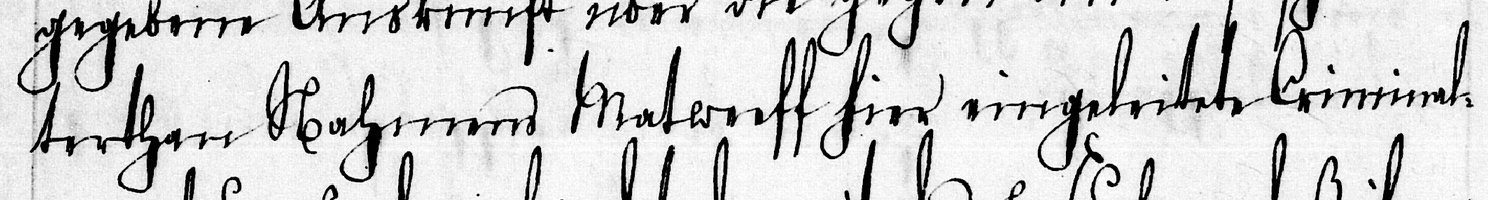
terthan Nahmens Matweeff hier eingeleitete Crimina¬
